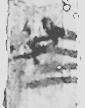罔
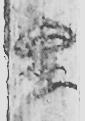畏
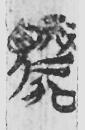{麗見}
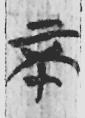不
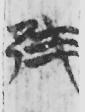隹
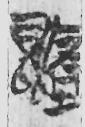{雁鸟土}
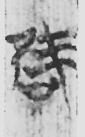唯
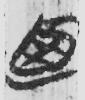廼
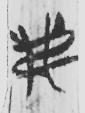弗
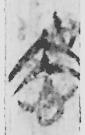{吳心}
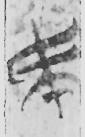民
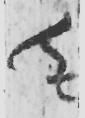氒
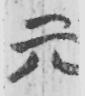亓
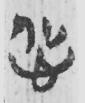{化心}（禍）
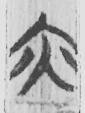亦
